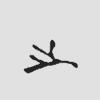出
